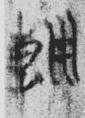朝
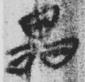晶（三）
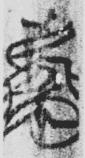○（表）
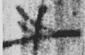之
